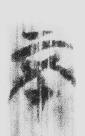不
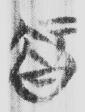智
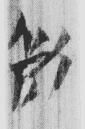死
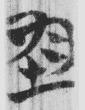均
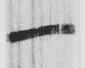一
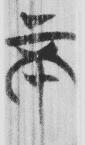不
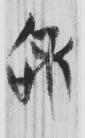和
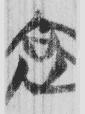哀
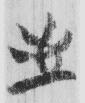至
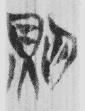則
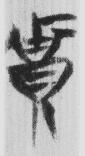貴
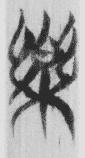樂
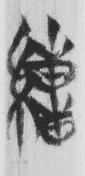{糸東田}
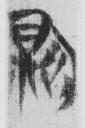則
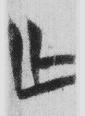亡
